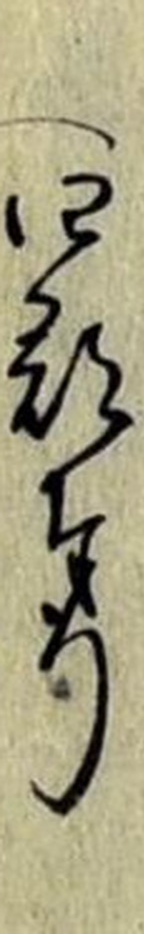四郡奉行
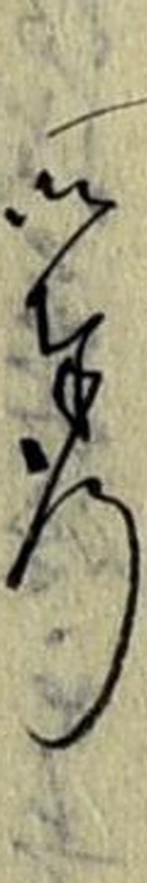御奉行
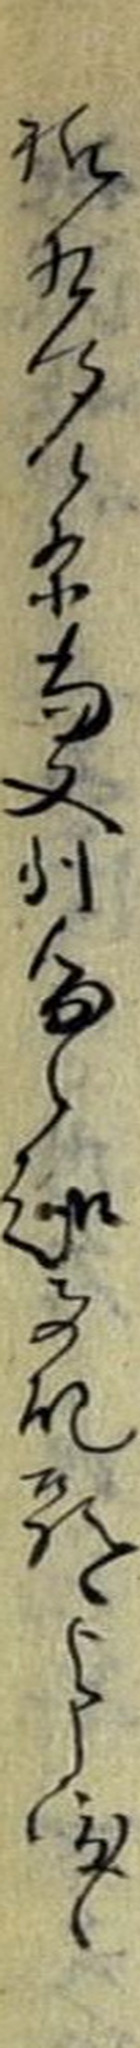様相聞候条尚又別紙之趣支配頭へ被申渡之
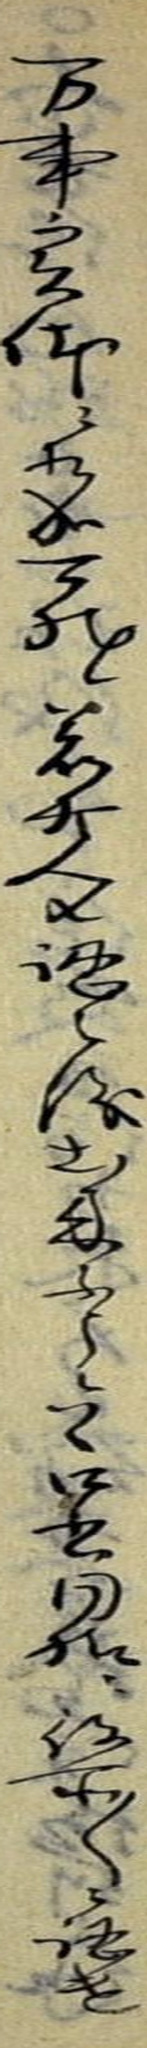万事費聊に相成可然候若村人共認之儀出来不申候はヽ口書同様に役所〳〵に語遣
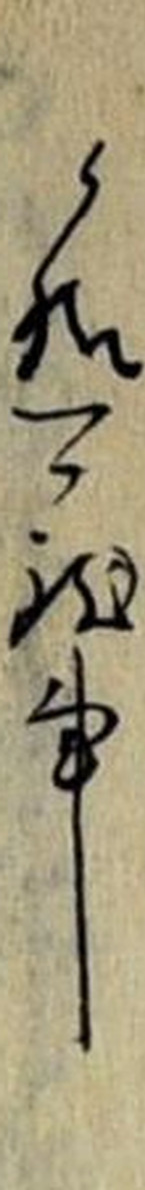候様可致事
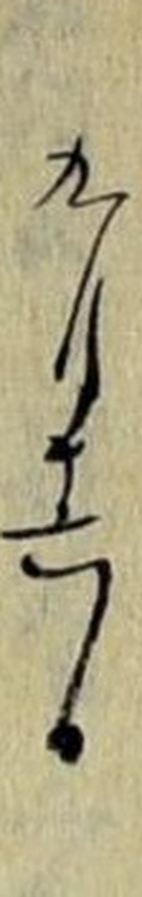九月十六日
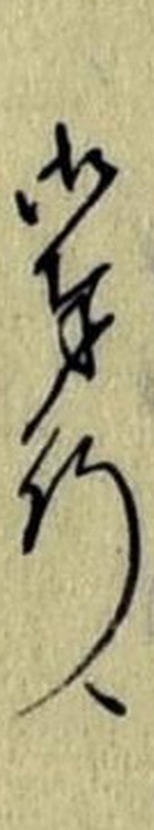御奉行
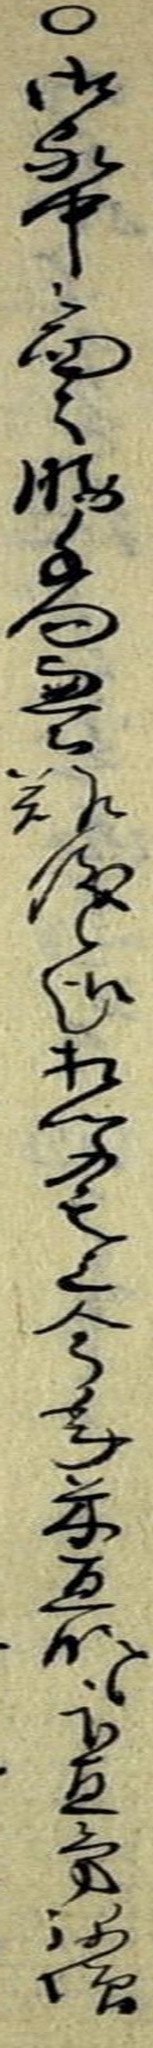○御家中之面々勝手向兼而難儀之趣相聞其上今年米直段も下直旁弥増
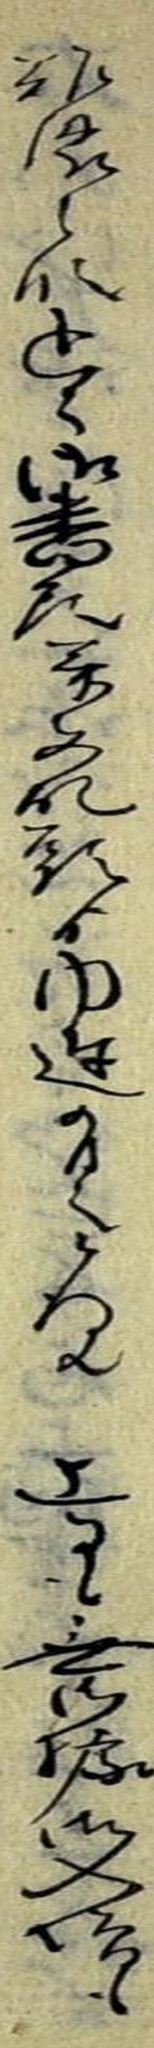難澁之段追々御番頭并支配頭ゟ内達有之候得共上にも無御拠御入増も
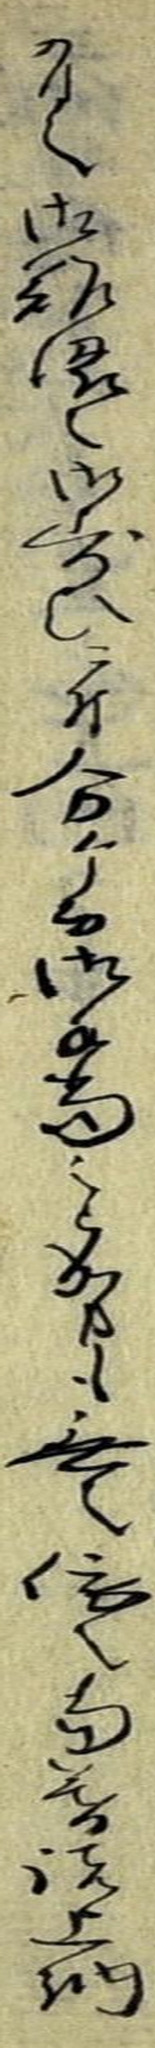有之御難渋之御歩ひに付分ヶ而御手当之被成方も無之依之当暮諸上納
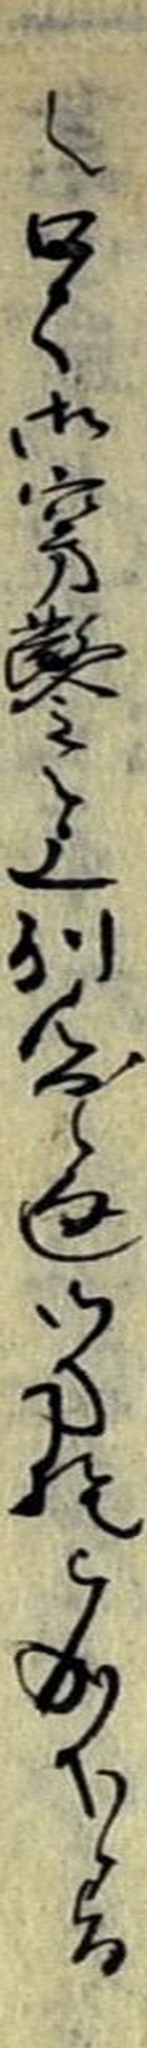之口々御穿鑿之上別紙之通御用捨被成下候旨
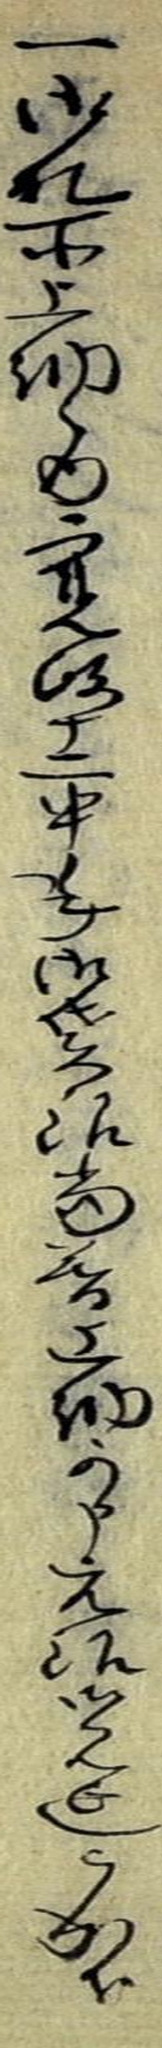一御札所上納之内寛政十二申年御貸銀当暮上納可申元銀御見延被成下
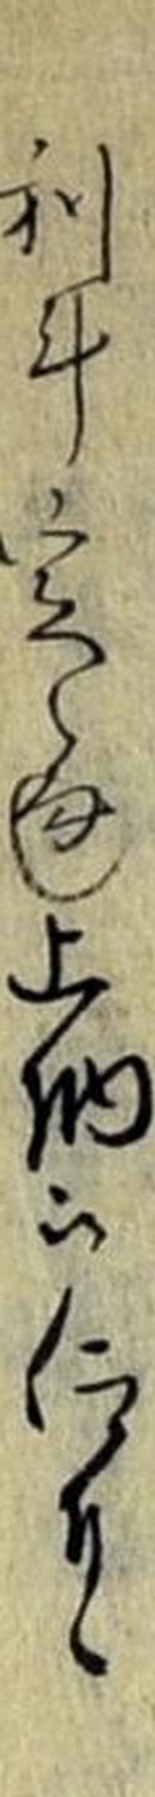利斗定之通上納被仰付候
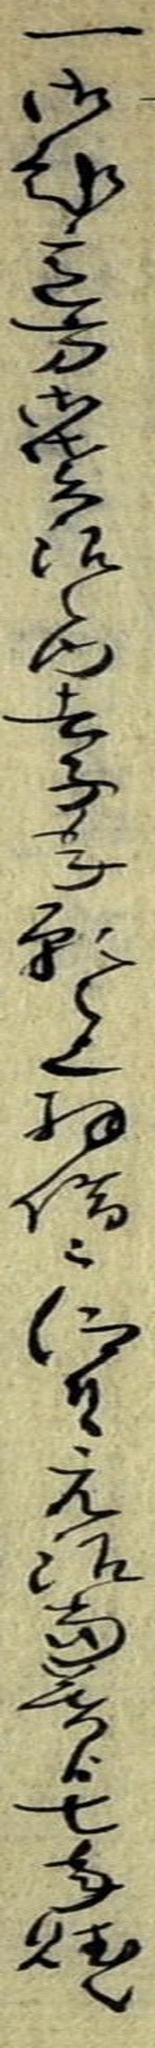一御趣意方御貸銀之内去子年願之上拝借被仰付候元銀当暮ゟ七年賦之
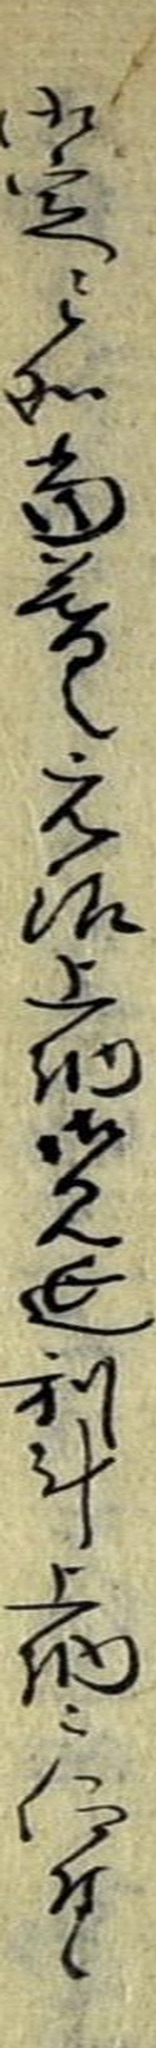御定に候処当暮之元銀上納御見延利斗上納被仰付候
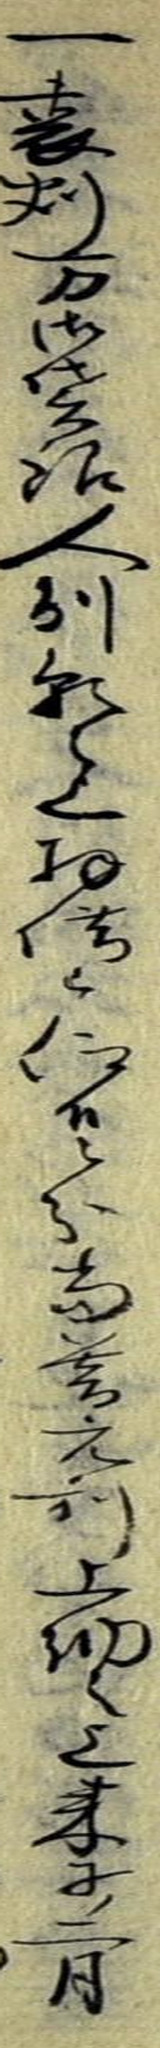一裏判方御貸銀人別願上拝借被仰付候分当暮元利上納之上來子二月
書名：命令之部 四
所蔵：福井県文書館 Fukui Prefectural Archives
